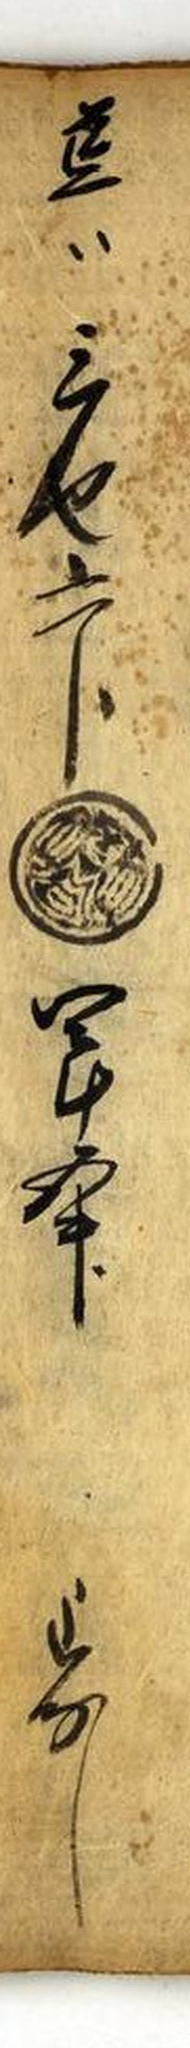荒同三セ六分㊞四斗五升主なし
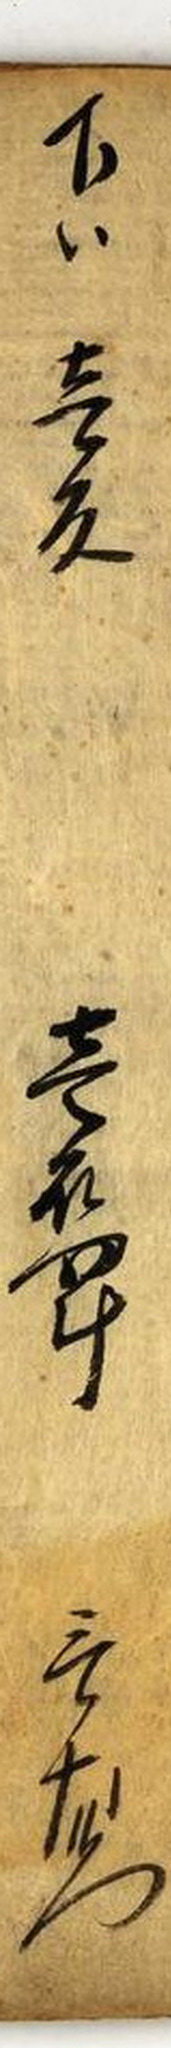下同壱反壱石四斗三郎左衛門
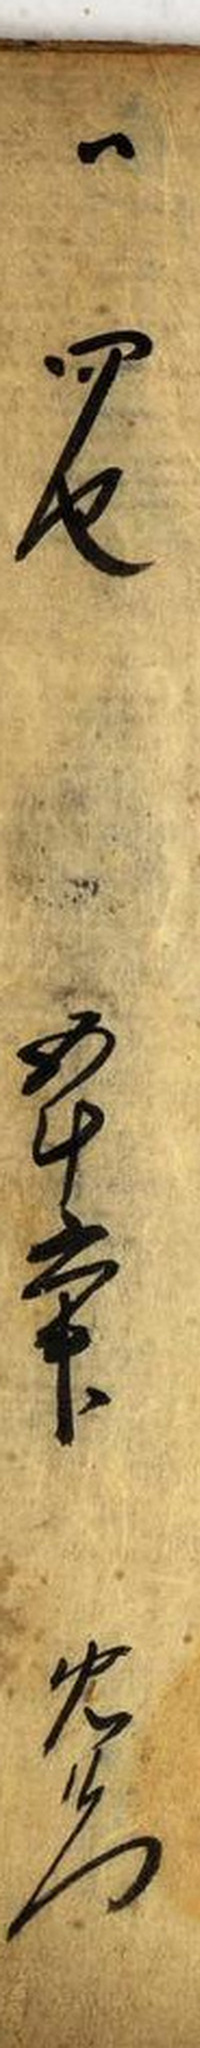同四セ五斗六升忠右衛門
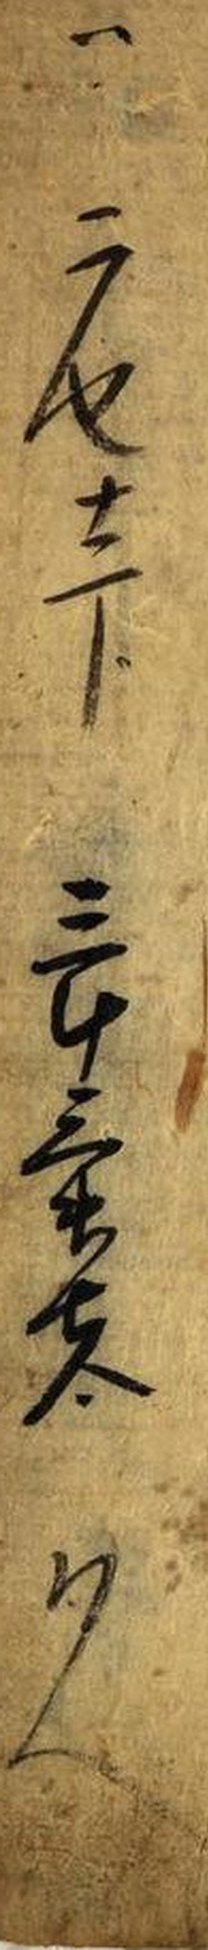同二セ十二分三斗三升七合同人

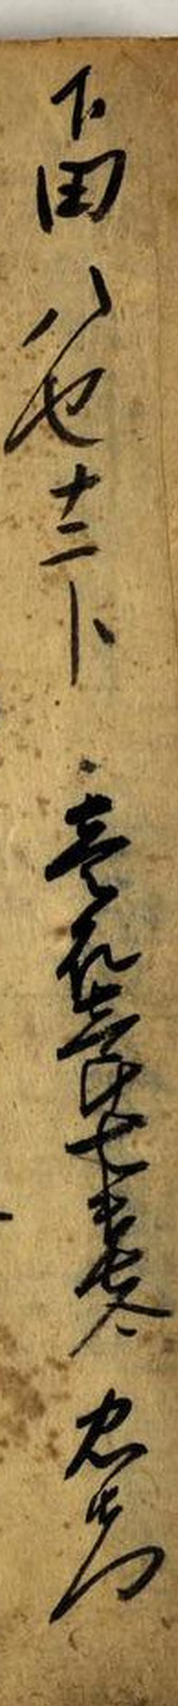下田八セ十二分壱石壱斗七升七合忠右衛門
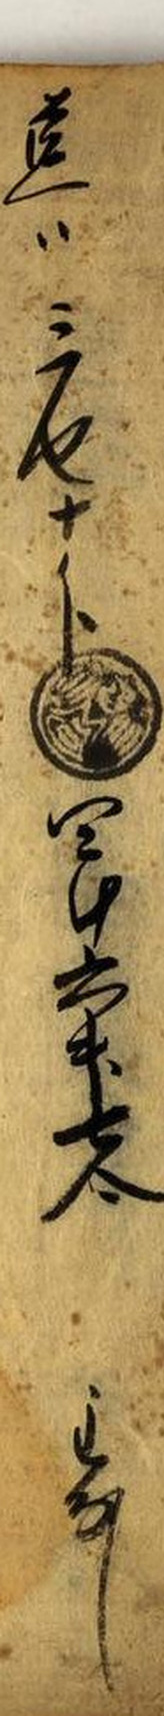荒田三セ十分㊞四斗六升七合主なし
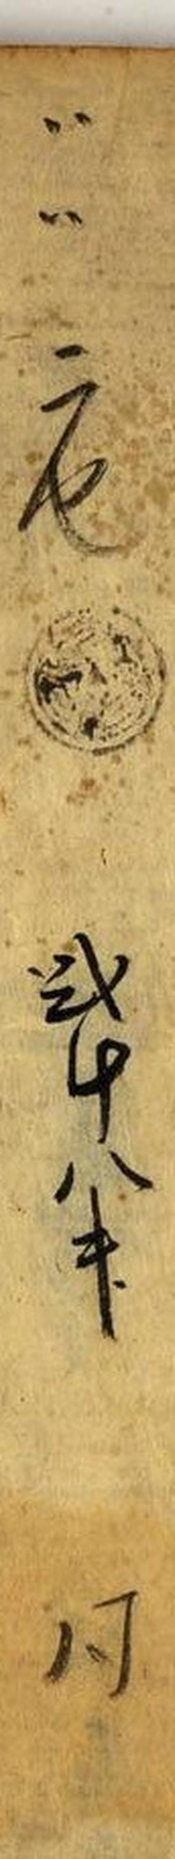同同二セ㊞弐斗八升同
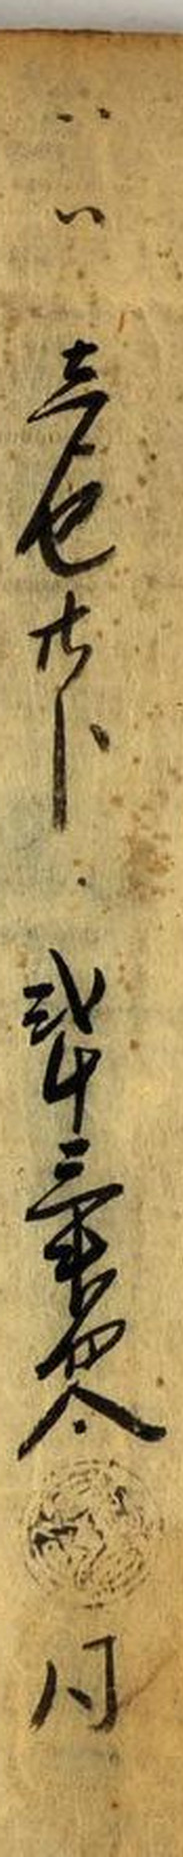同同壱セ廿分弐斗三升四合㊞同
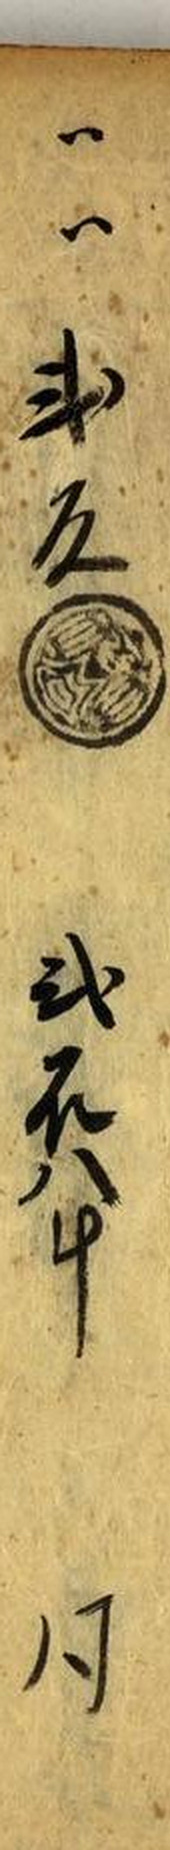同同弐反㊞弐石八斗同
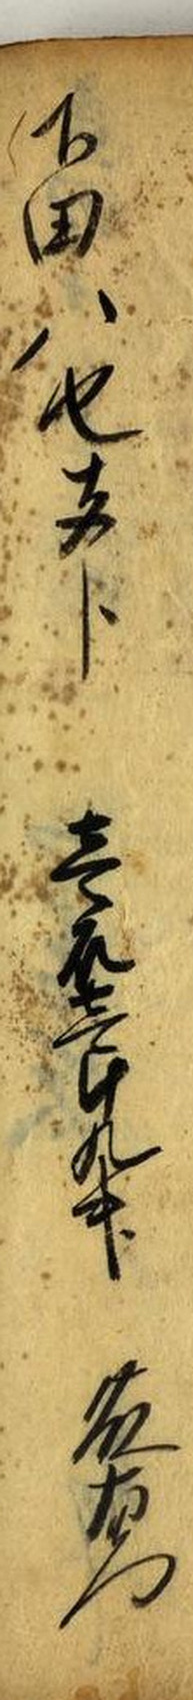下田八セ十五分壱石壱斗九升藤左衛門
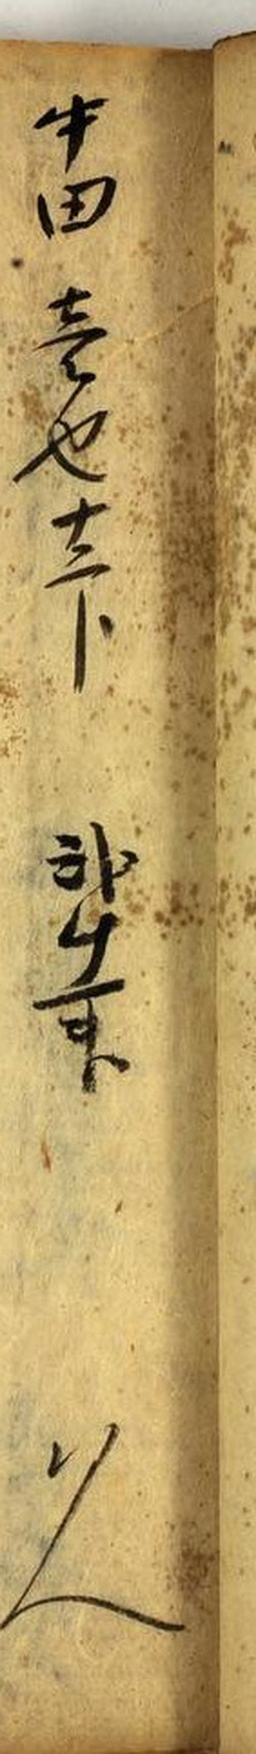中田壱セ十二分弐斗一升同人
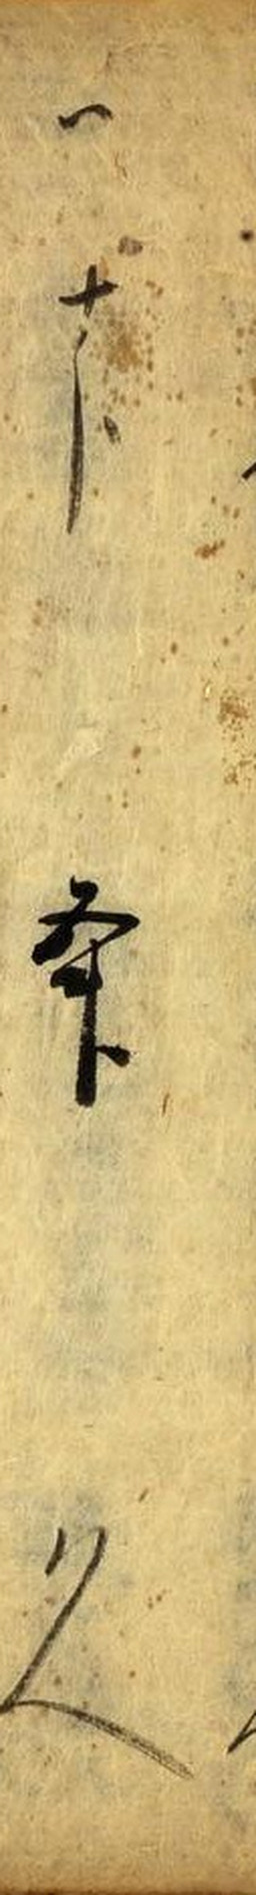同十分五升同人
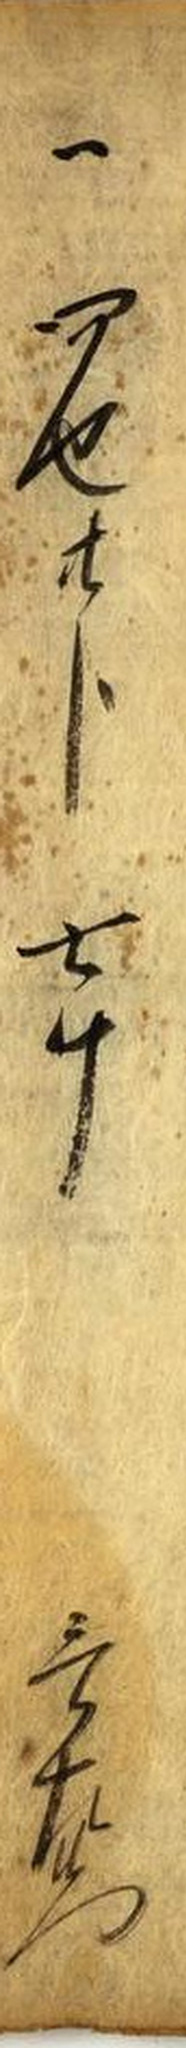同四セ廿分七斗三郎左衛門
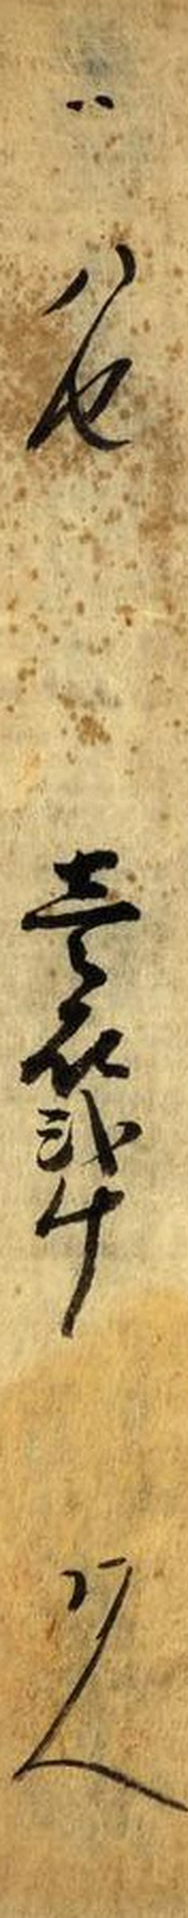同八セ壱石弐斗同人
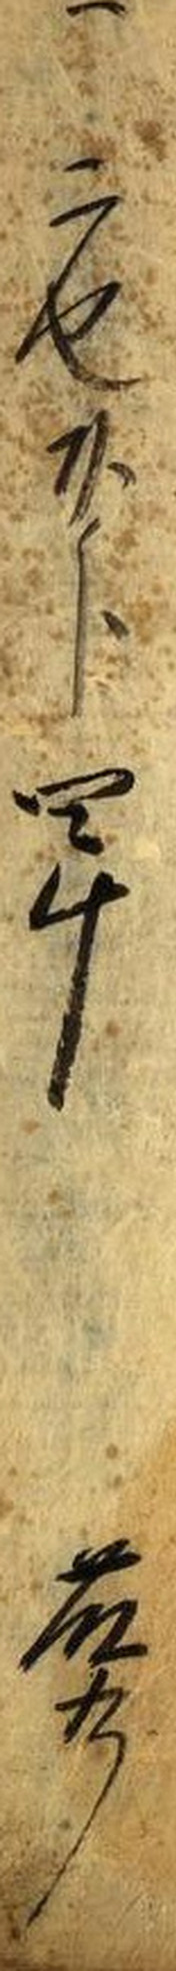同二セ廿分四斗藤九郎

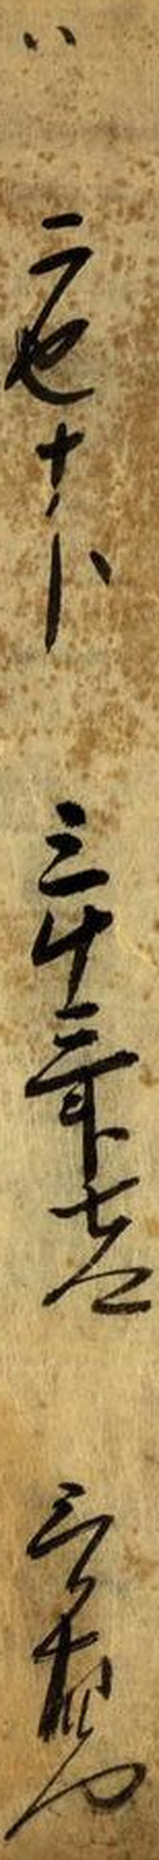同二セ十分三斗三升七合三郎左衛門
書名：越前国西方内志津庄内本折村御検地帳
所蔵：福井県文書館 Fukui Prefectural Archives
